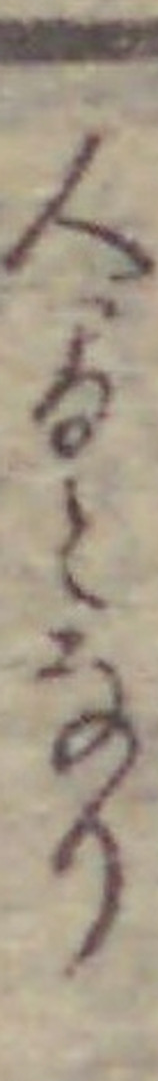人間となり
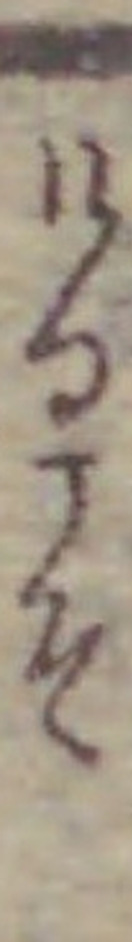けるこそ
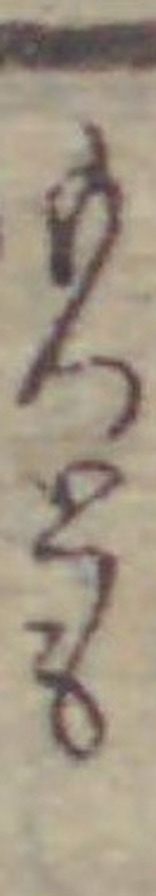もつとも
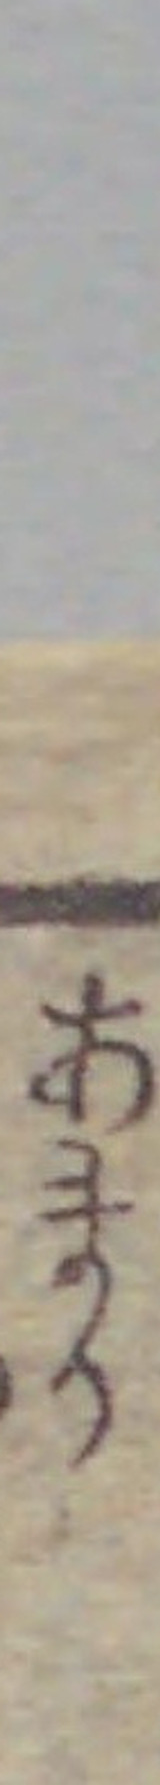あまり
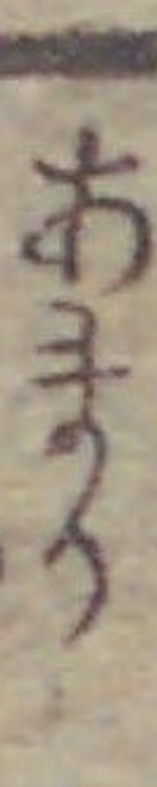あまり
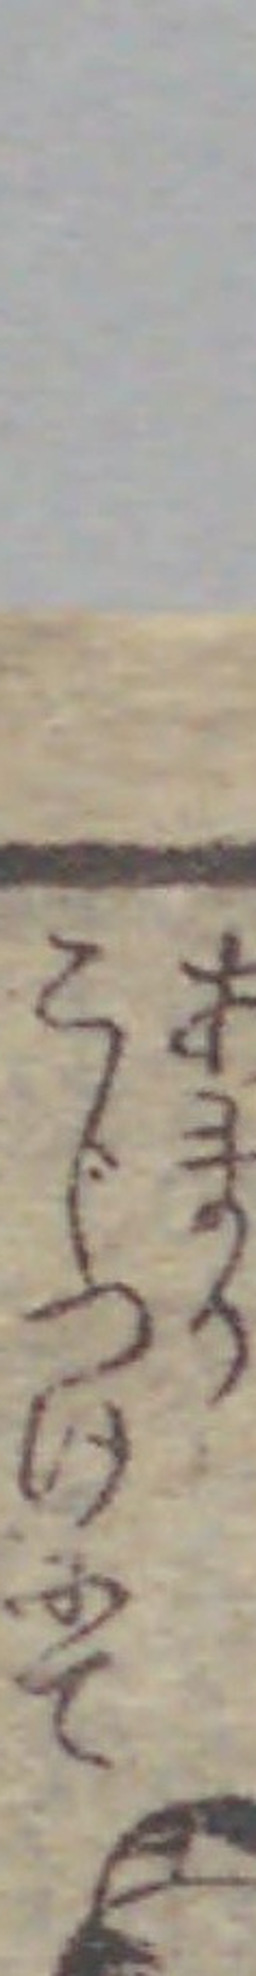こじつけにて
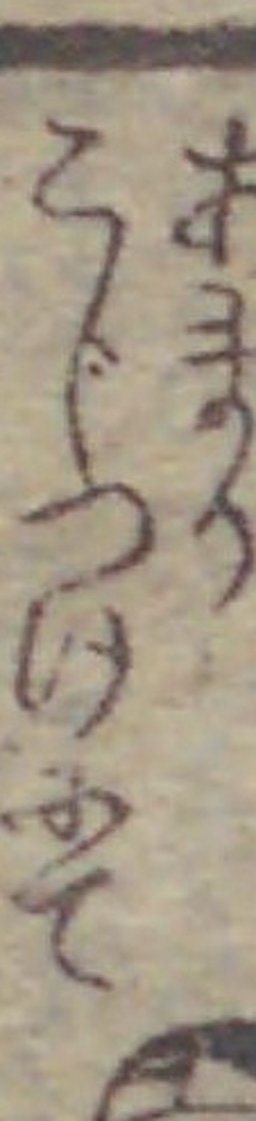こじつけにて
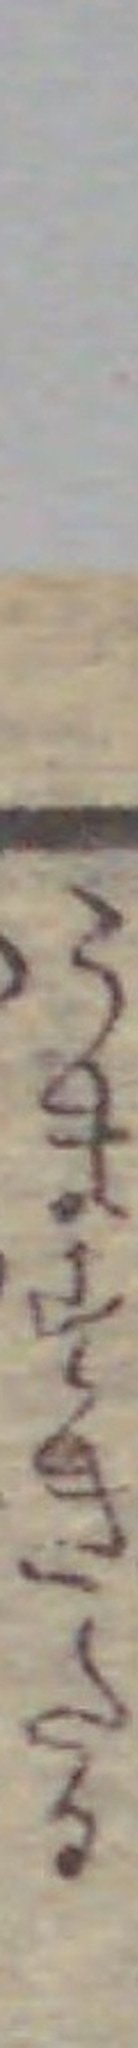うますぎたる
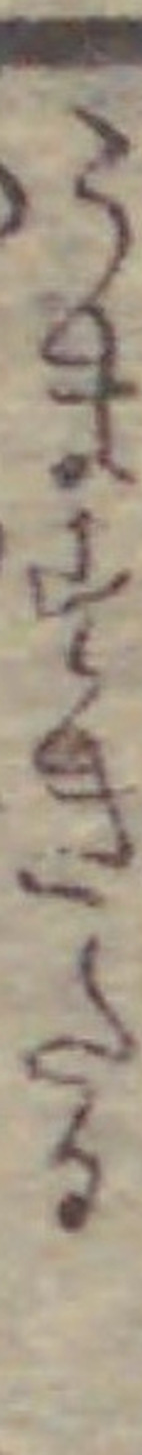うますぎたる
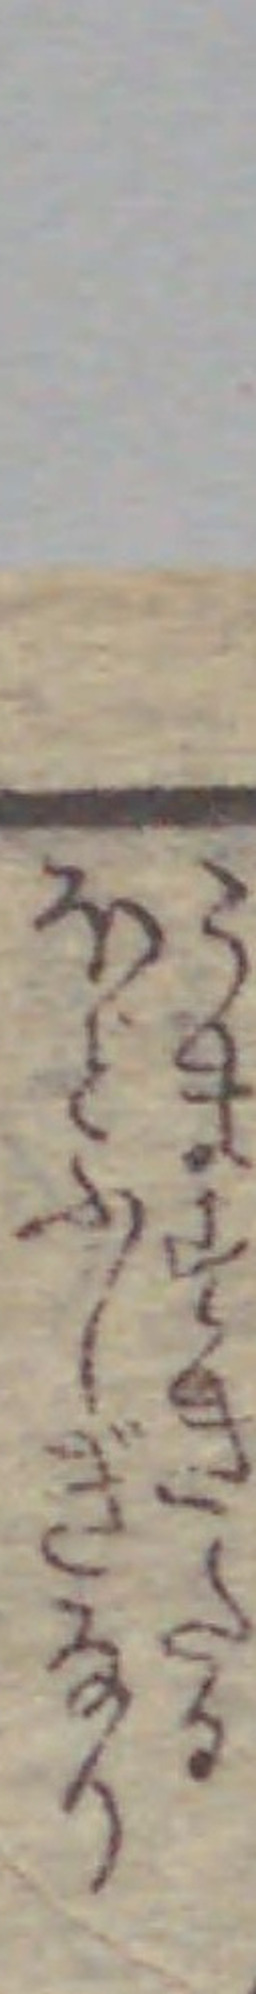ほどふしぎなり
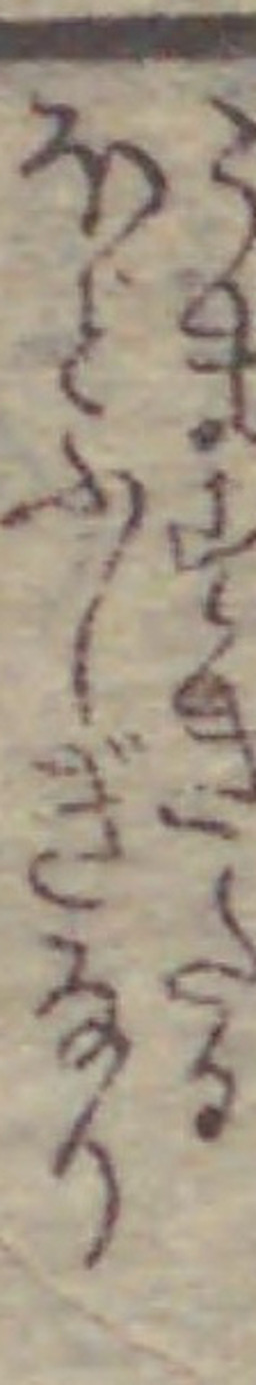ほどふしぎなり
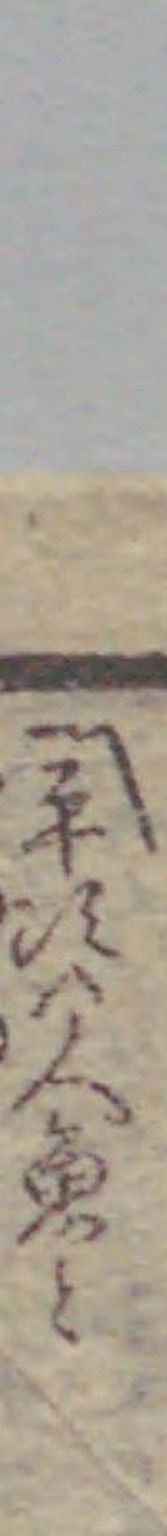〽平次は人魚と
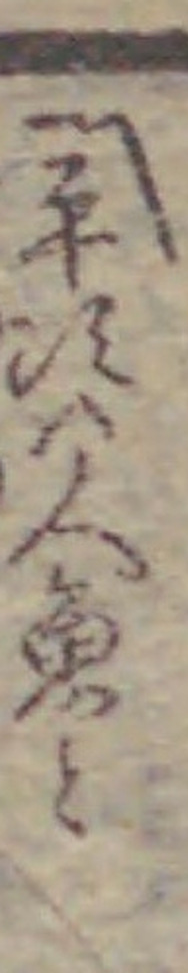〽平次は人魚と
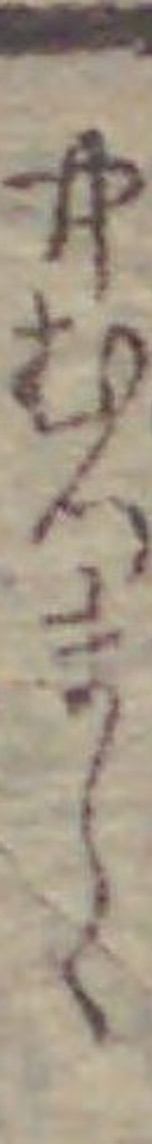中むつましく
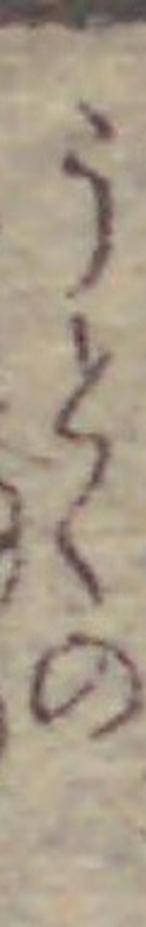うとくの
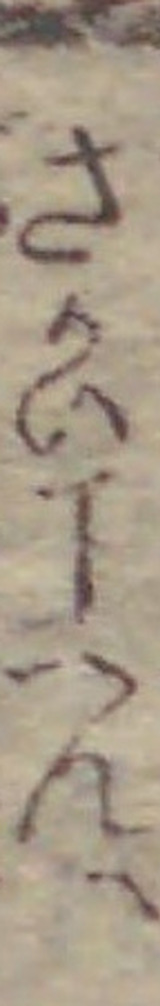さかい丁へんへ
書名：箱入娘面屋人魚 3巻
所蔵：国立国会図書館 National Diet Library, JAPAN
